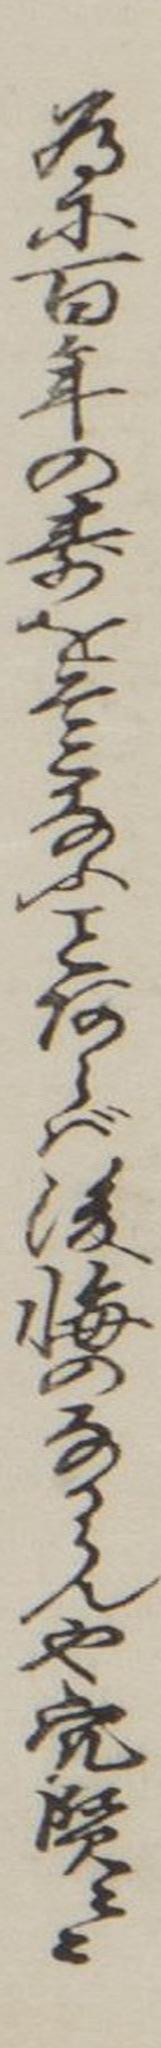為に百年の寿をそこなふことあらば後悔のなからんや穴覧々々
